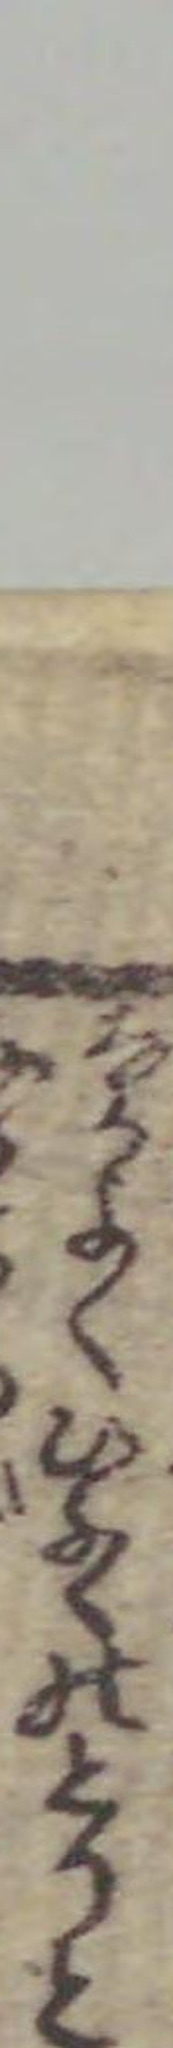なかよくひよくのとりと
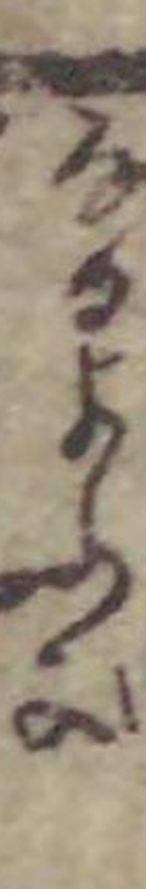なるように
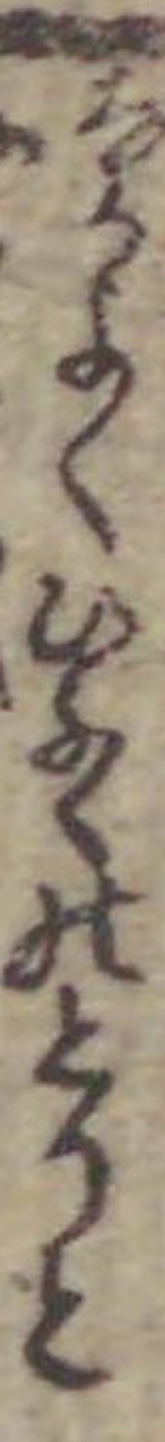なかよくひよくのとりと
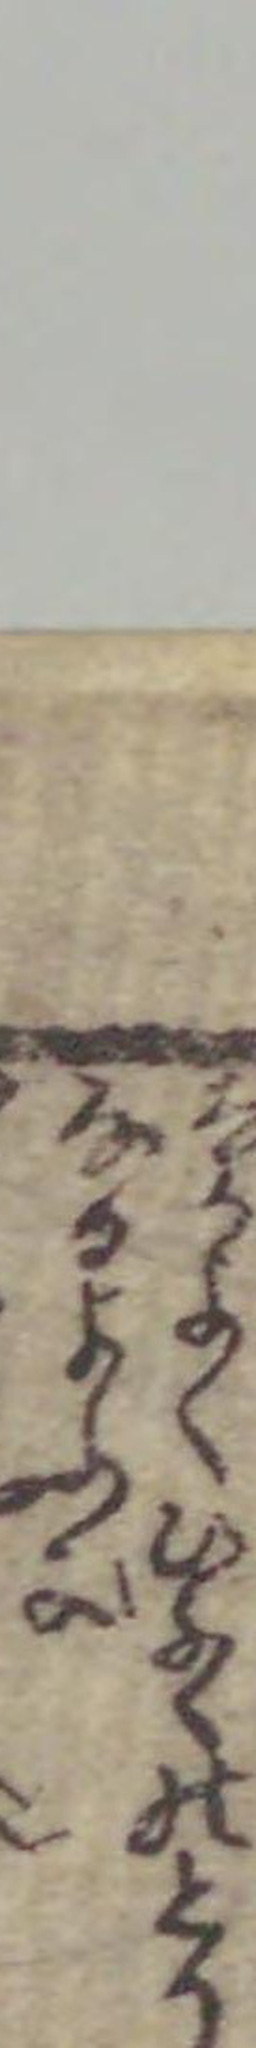なるように
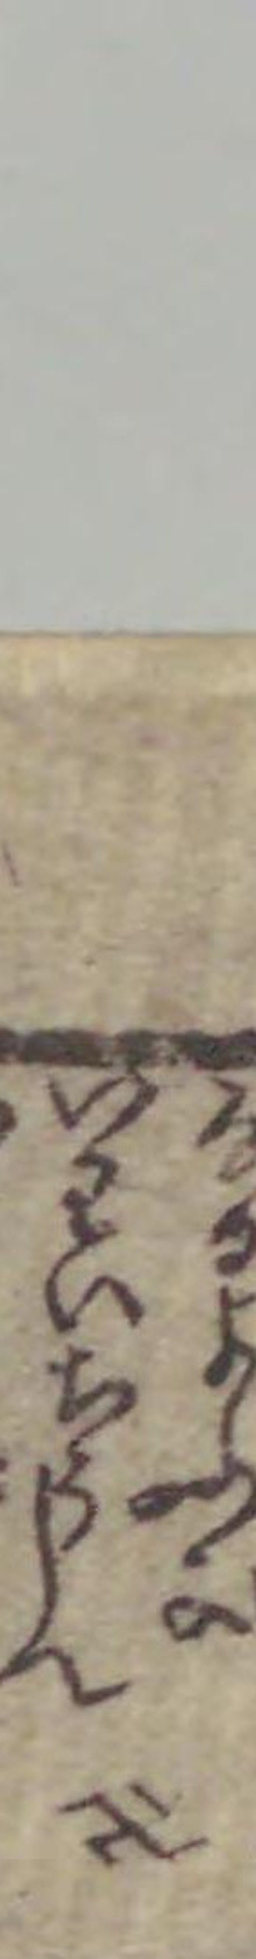いわいちうしん
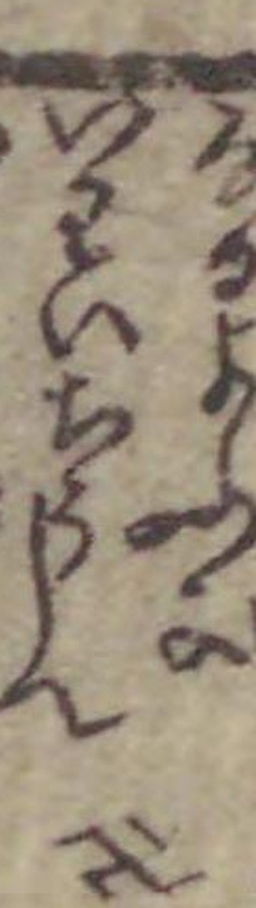いわいちうしん
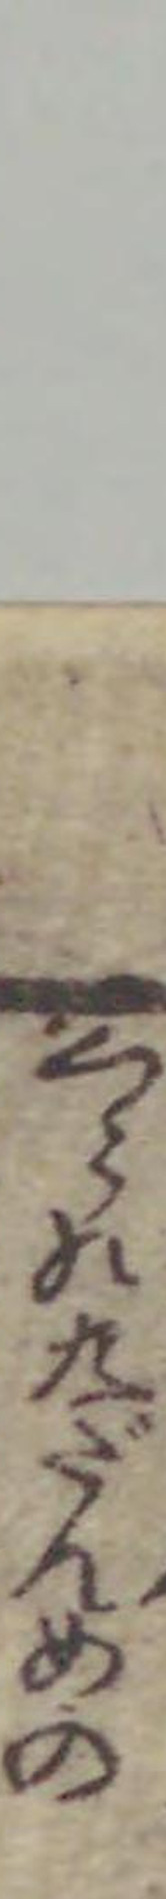くらの九だんめの
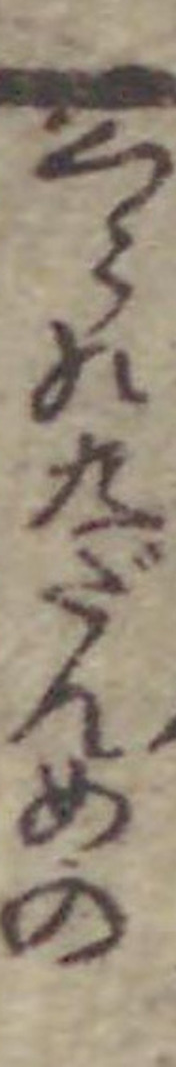くらの九だんめの
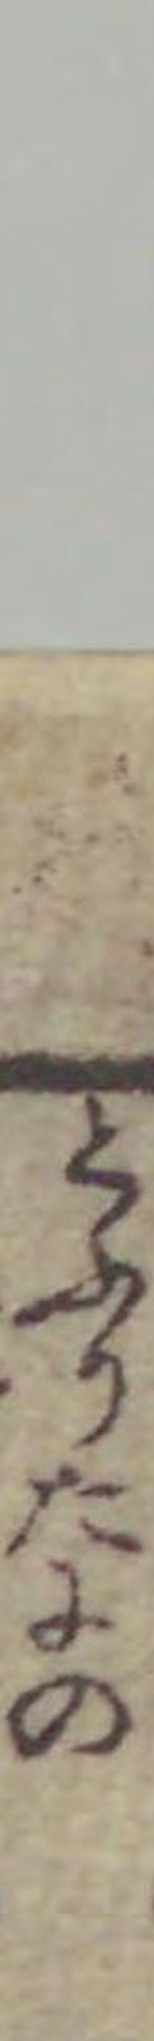とふりたにの
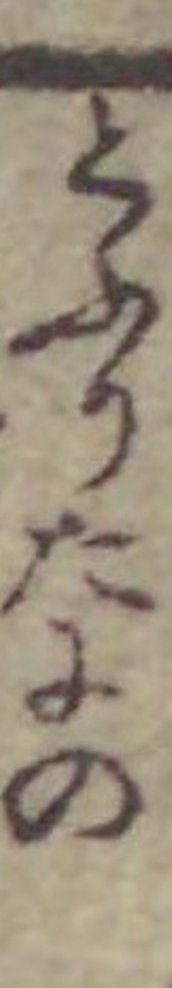とふりたにの
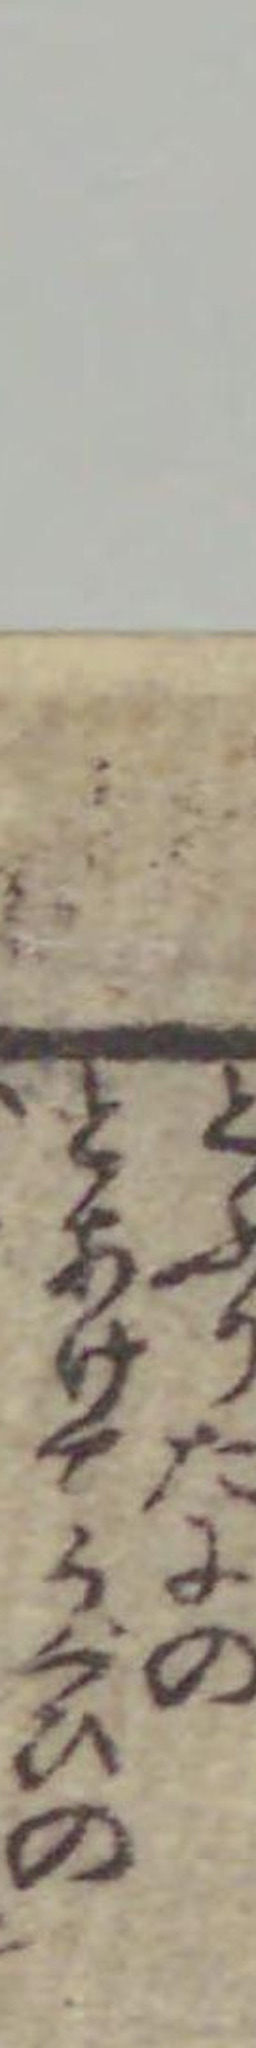とあけてうくひの
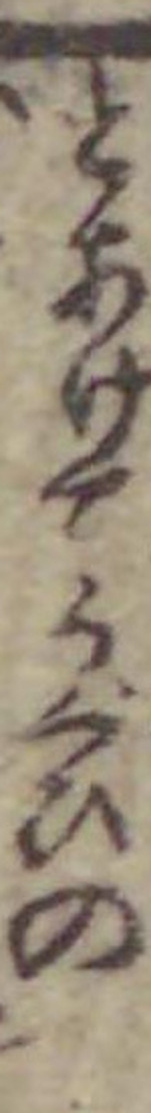とあけてうくひの
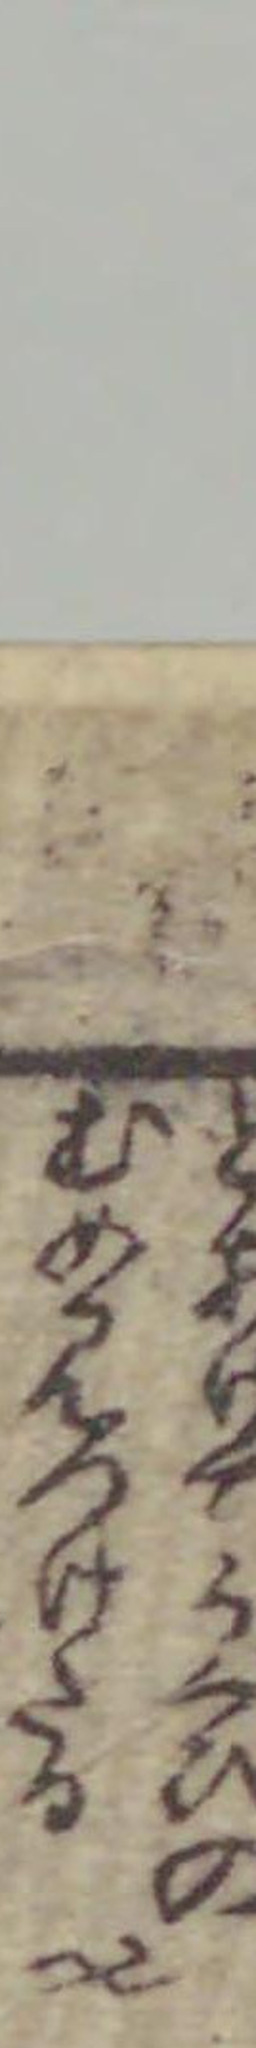むめ見つけたる
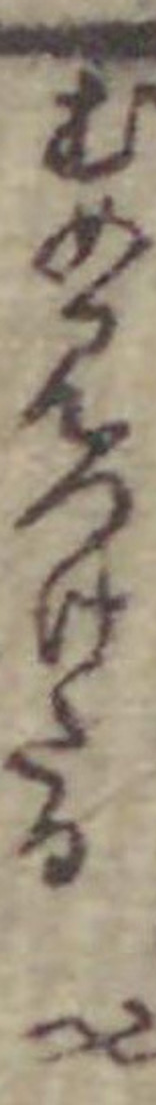むめ見つけたる
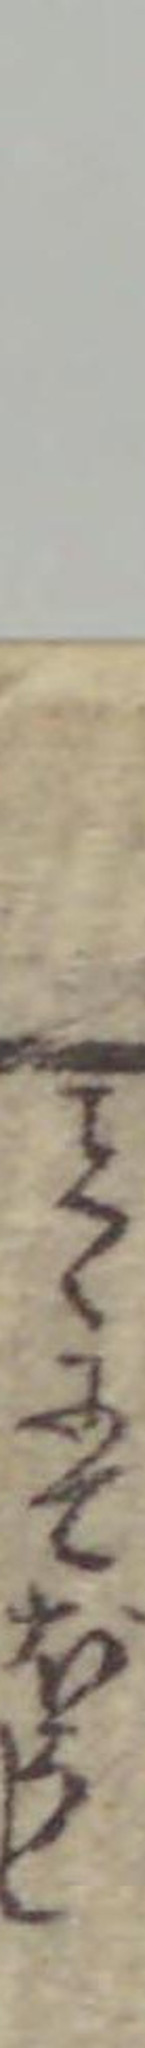ことくにてほうし
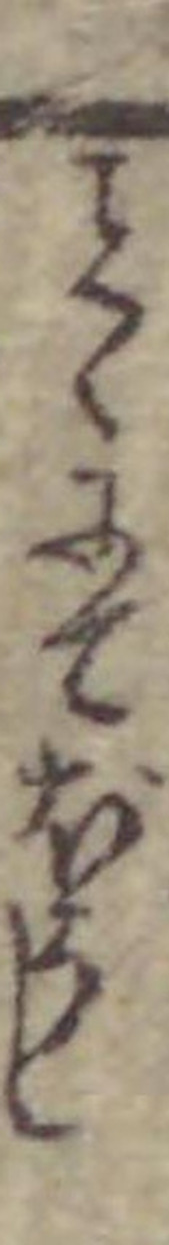ことくにてほうし
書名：烏行水諺草 3巻
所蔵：国立国会図書館 National Diet Library, JAPAN
